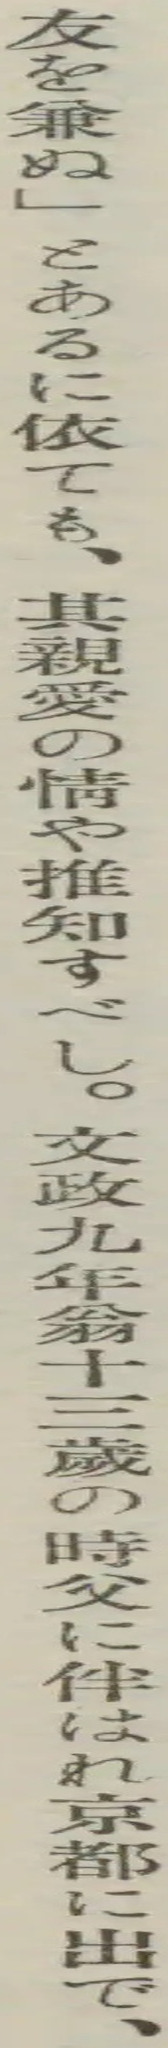友を兼ぬ」とあるに依ても、其親愛の情や推知すべし。文政九年翁十三歳の時父に伴はれ京都に出で、
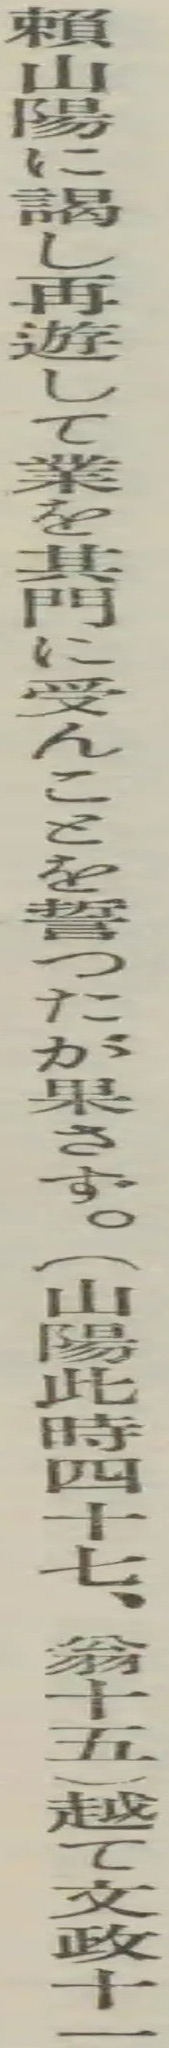頼山陽に謁し再遊して業を其門に受んことを誓つたが果さず。(山陽此時四十七、翁十五)越て文政十一
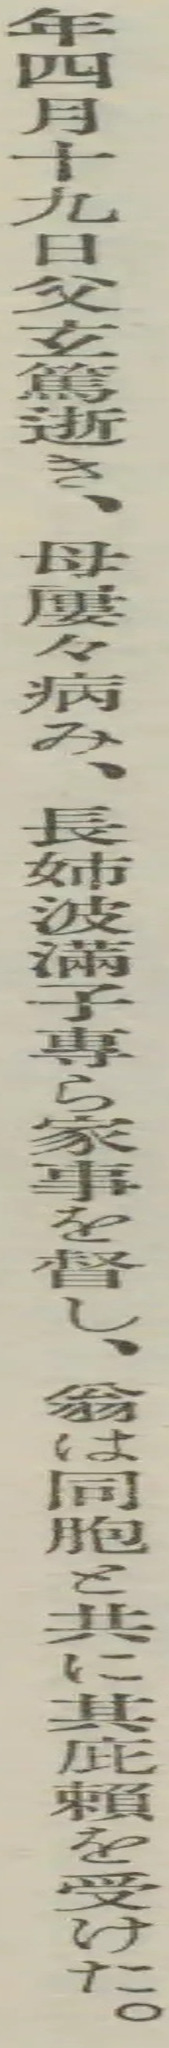年四月十九日父玄篤逝き、母屢々病み、長姉波満子専ら家事を督し、翁は同胞と共に其庇頼を受けた。
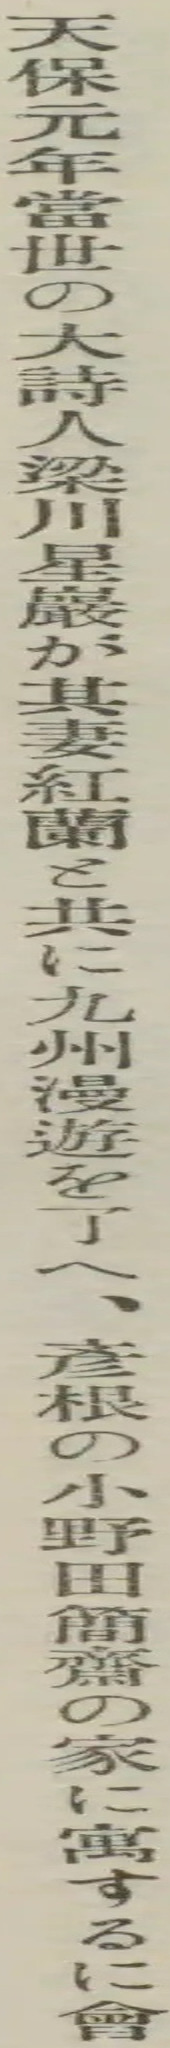天保元年当世の大詩人梁川星巌が其妻紅蘭と共に九州漫遊を了へ、彦根の小野田簡齋の家に寓するに会
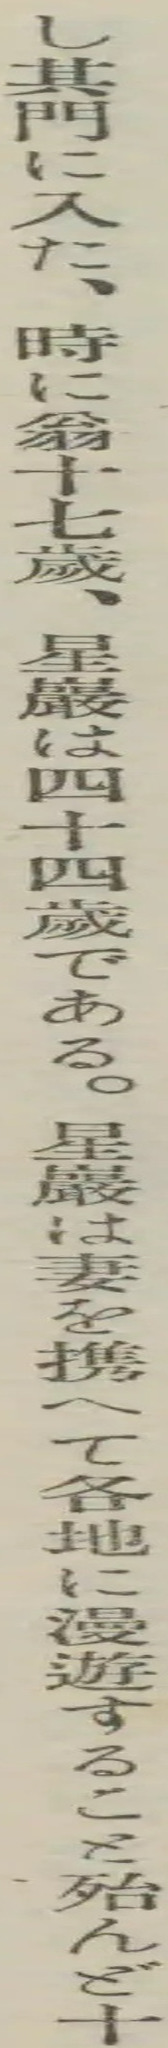し其門に入た、時に翁十七歳、星巌は四十四歳である。星巌は妻を携へて各地に漫遊すること殆んど十
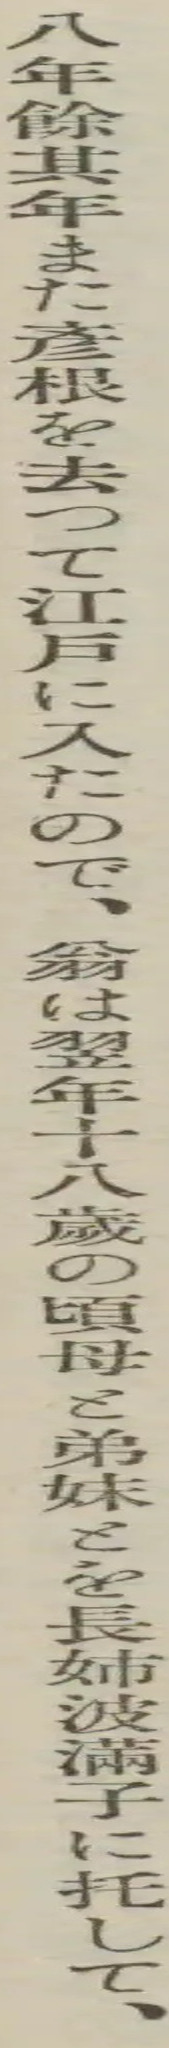八年余其年また彦根を去つて江戸に入たので、翁は翌年十八歳の頃母と弟妹とを長姉波満子に託して、
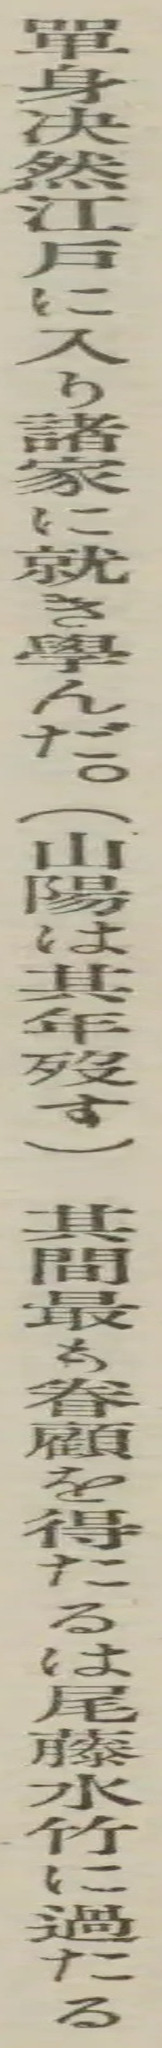単身決然江戸に入り諸家に就き学んだ。(山陽は其年歿す)其間最も眷顧を得たるは尾藤水竹に過たる
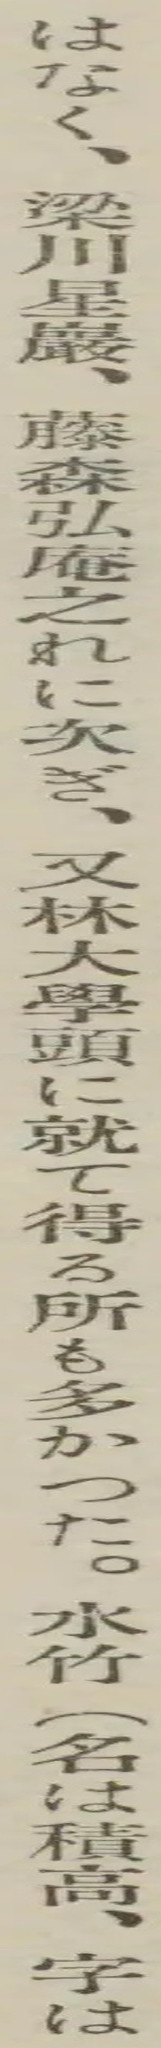はなく、梁川星巌、藤森弘庵之れに次ぎ、又林大学頭に就て得る所も多かつた。水竹(名は積高、字は
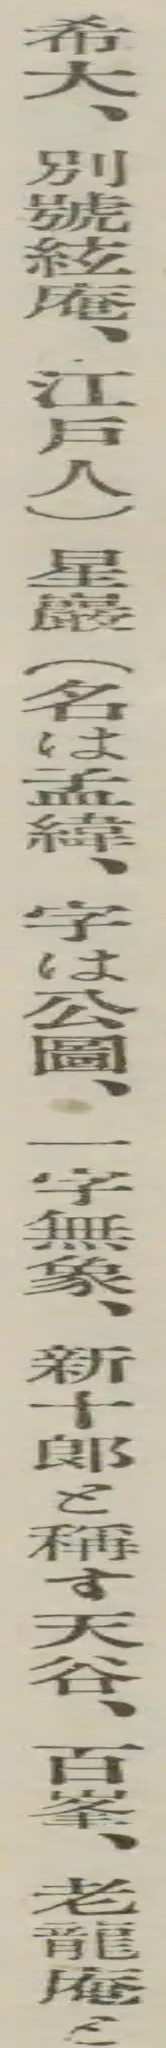希大、別号絃庵、江戸人)星巌(名は孟緯、字は公圖、一字無象、新十郎と称す天谷、百峯、老龍庵と
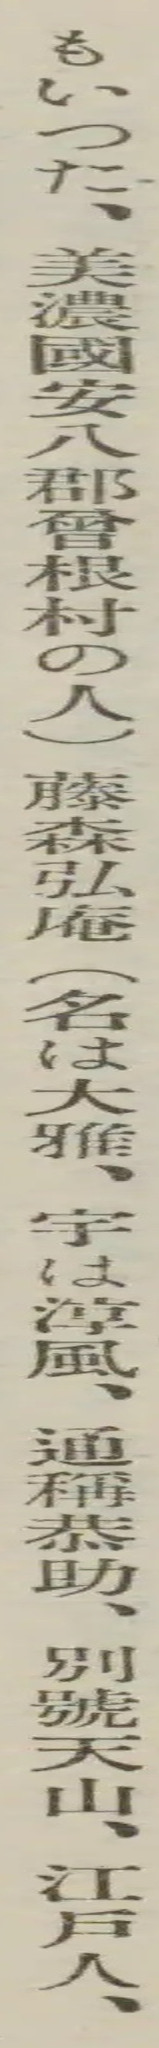もいつた、美濃国安八郡曽根村の人)藤森弘庵(名は大雅、字は淳風、通称恭助、別号天山、江戸人、
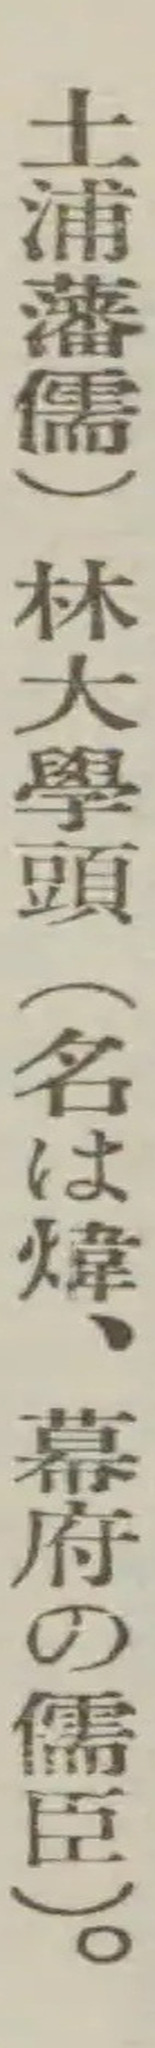土浦藩儒)林大学頭(名は煒、幕府の儒臣)。
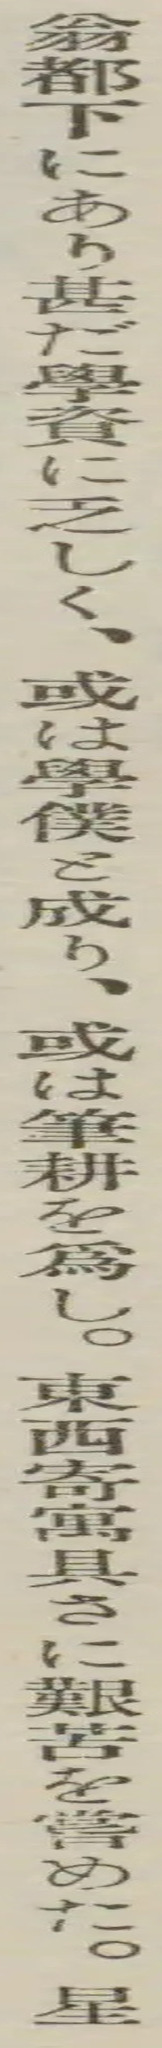翁都下にあり甚だ学資に乏しく、或は学僕と成り、或は筆耕を為し。東西寄寓具さに艱苦を嘗めた。星
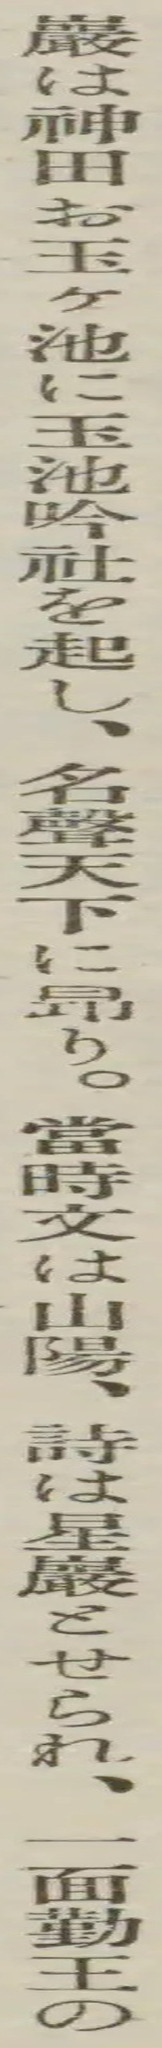巌は神田お玉ケ池に玉池吟社を起し、名声天下に昂り。当時文は山陽、詩は星巌とせられ、一面勤王の
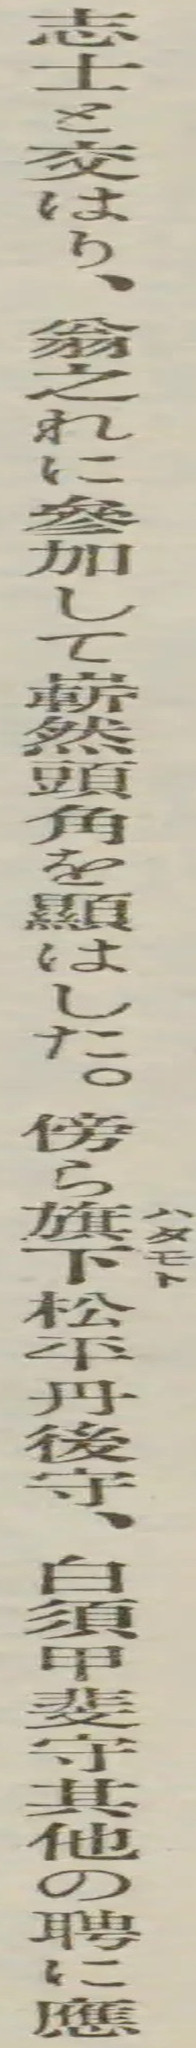志士と交わり、翁之れに参加して嶄然頭角を顕はした。旁ら旗本松平丹後守白須甲斐守其他の聘に応
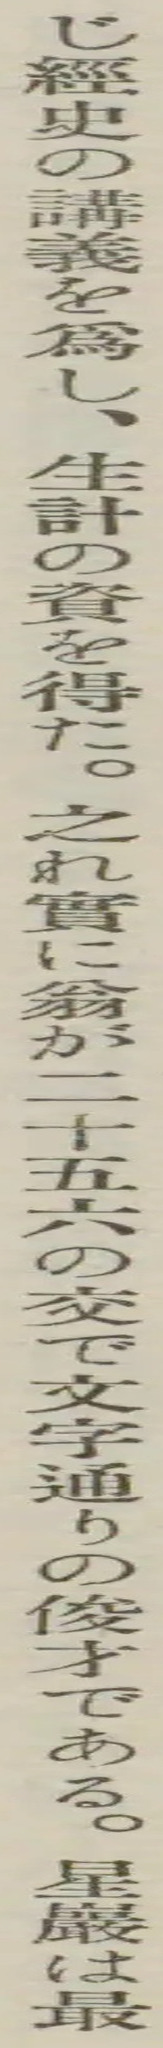じ経史の講義を為し、生計の資を得た。之れ実に翁が二十五六の交で文字通りの俊才である。星巌は最
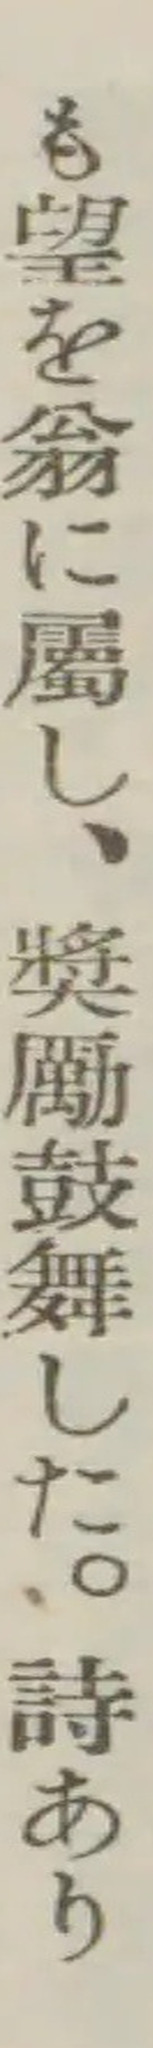も望を翁に属し、奨励鼓舞した。詩あり
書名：小野湖山翁小伝
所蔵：国立国会図書館 National Diet Library, JAPAN
